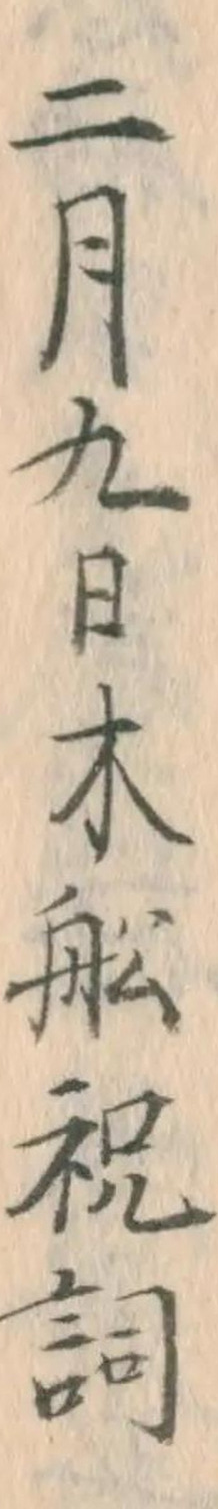二月九日木舩祝詞
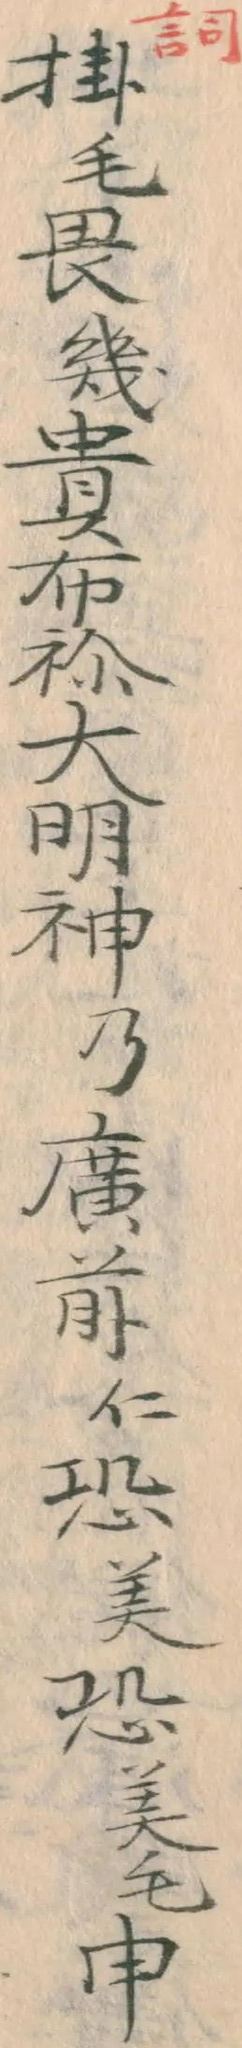掛毛畏幾貴布祢大明神乃広前仁恐美恐美毛申
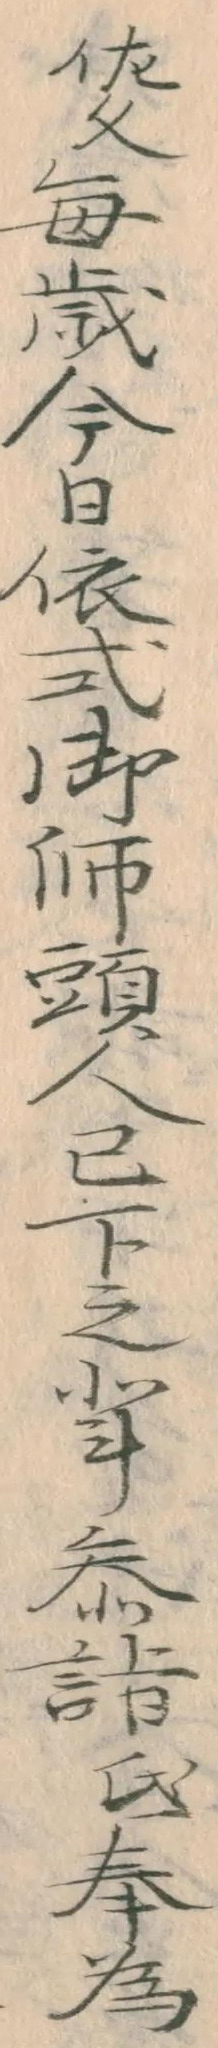佐久毎歳今日依式御師頭人已下之輩参詣氐奉為
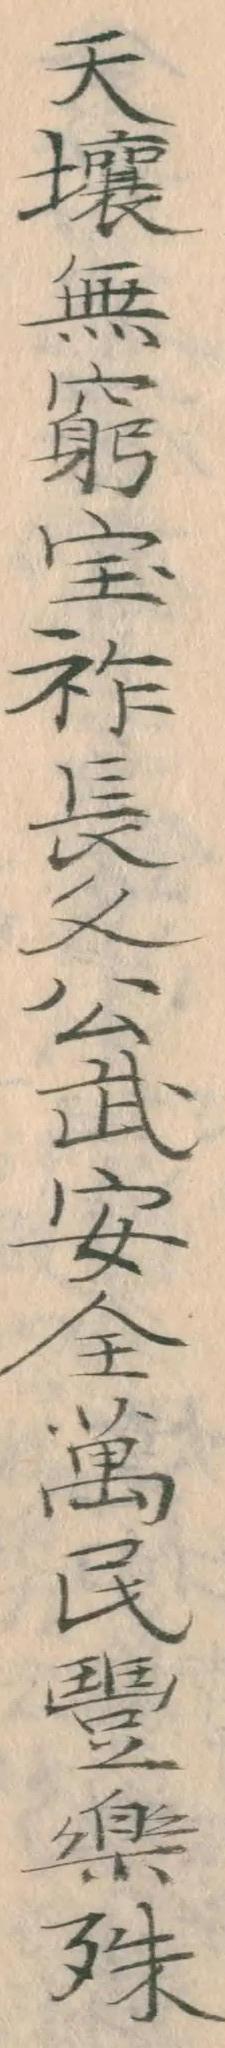天壌無窮宝祚長久公武安全萬民豊楽殊
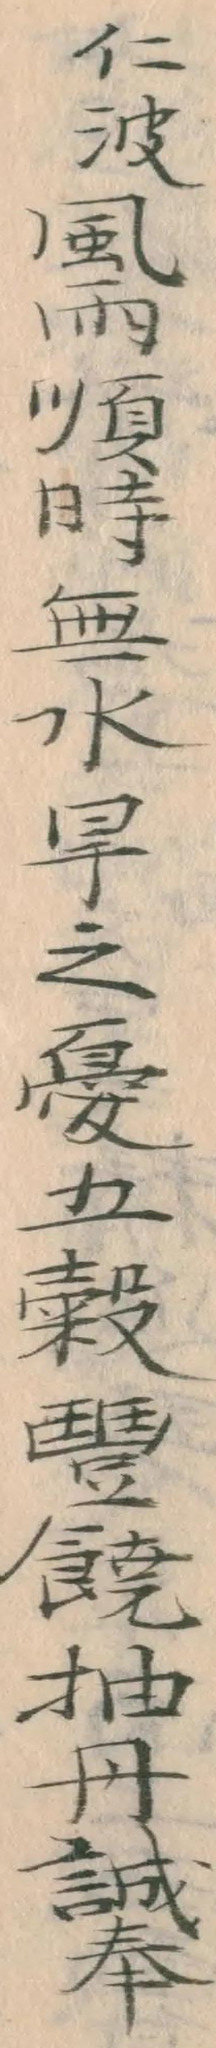仁波風雨順時無水旱之憂五穀豊饒抽丹誠奉
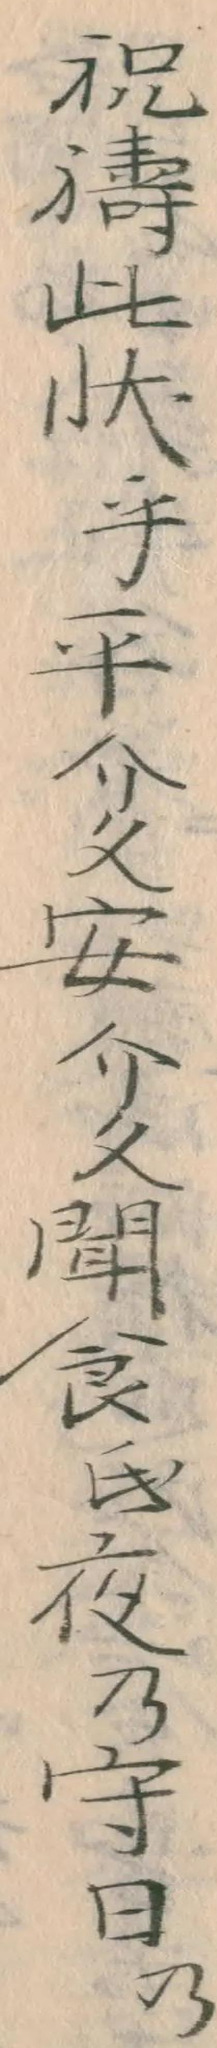祝祷此状乎平介久安介久聞食氐夜乃守日乃
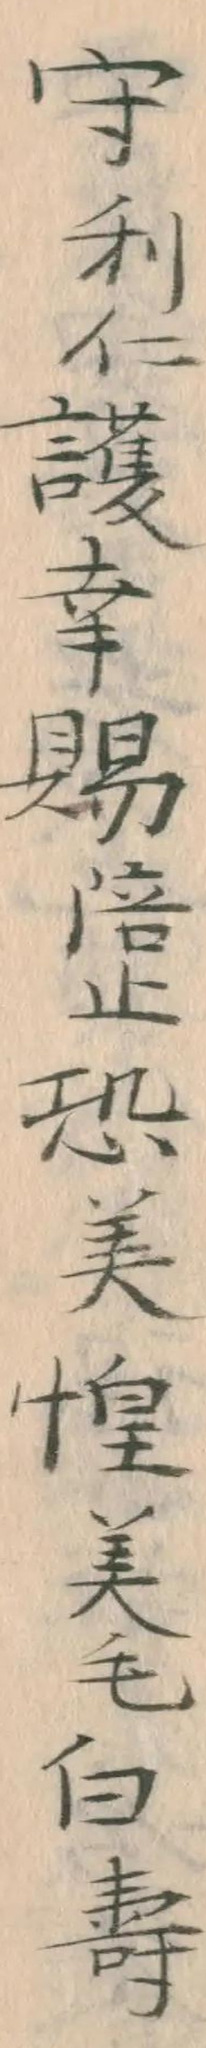守利仁護幸賜陪止恐美恐美毛白壽
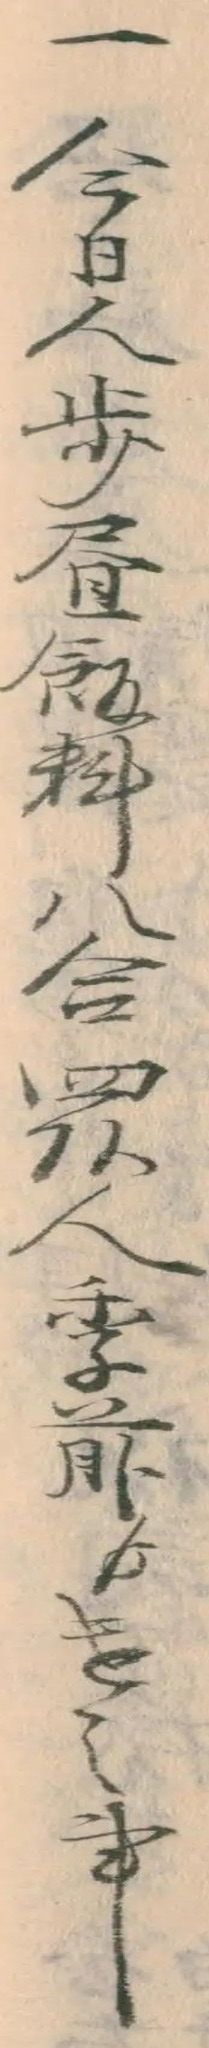一今日人歩昼飯料八合四頭人季前ゟ遣之事
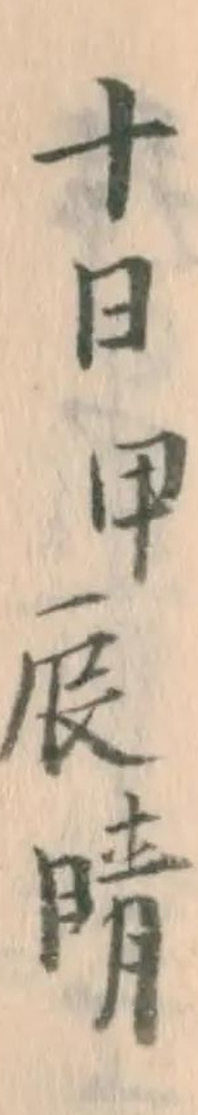十日甲辰晴
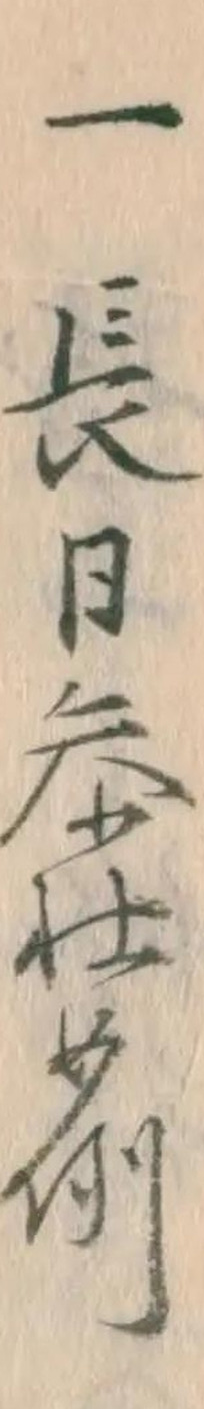一長日参社如例
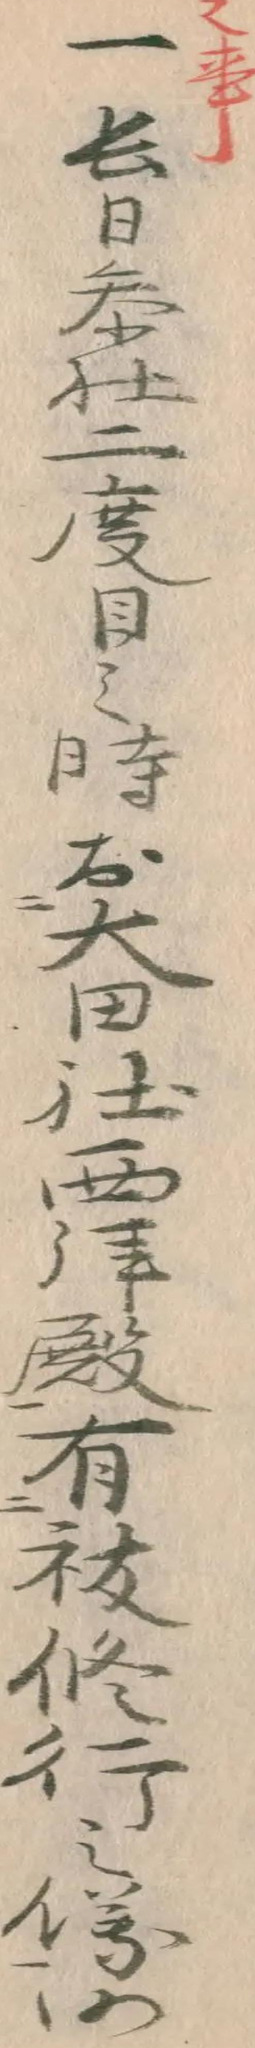一長日参社二度目之時於大田社西拝殿有祓修行之儀仍
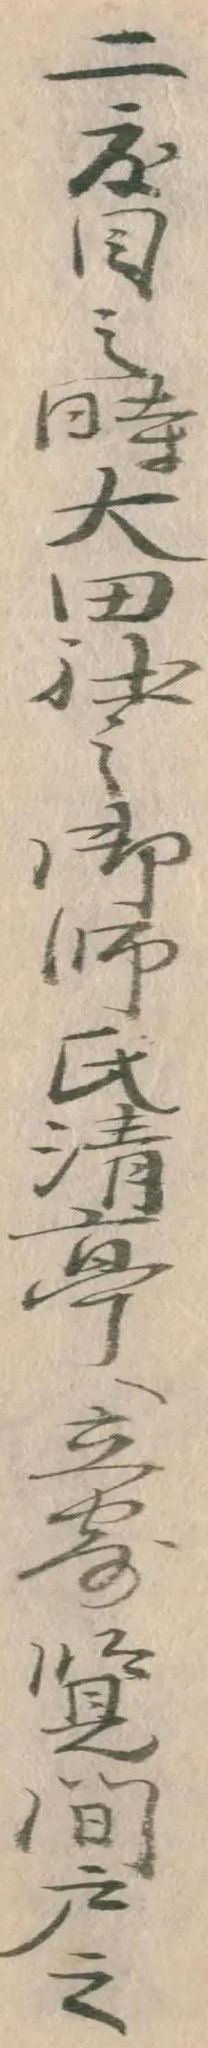二度目之時大田社之御師氏清亭へ立寄覧間戸之
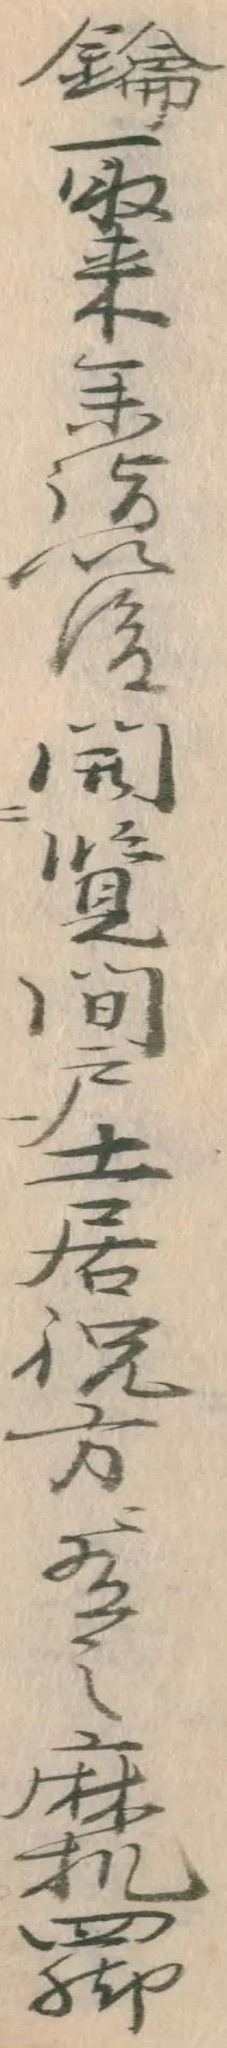鑰取来参詣以後開覧間戸土居祝方ニ有之麻机四脚
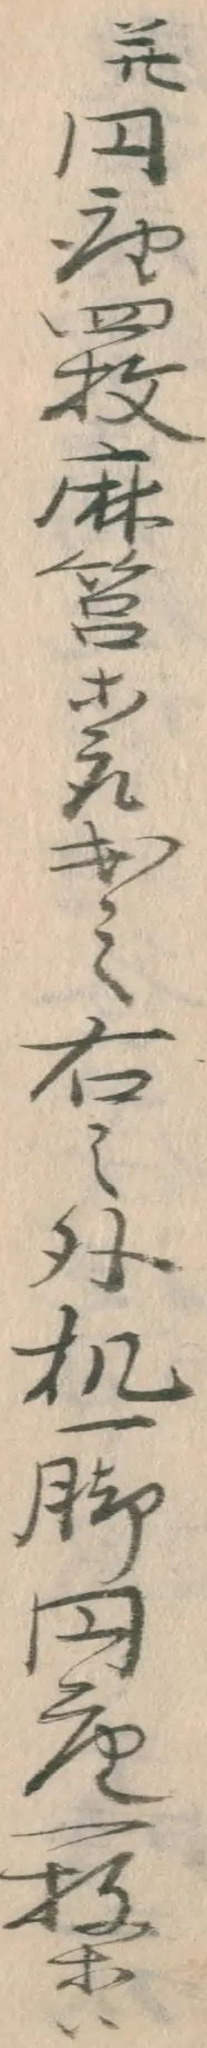并円座四枚麻筥等取出之右之外机一脚円庵一枚等ハ
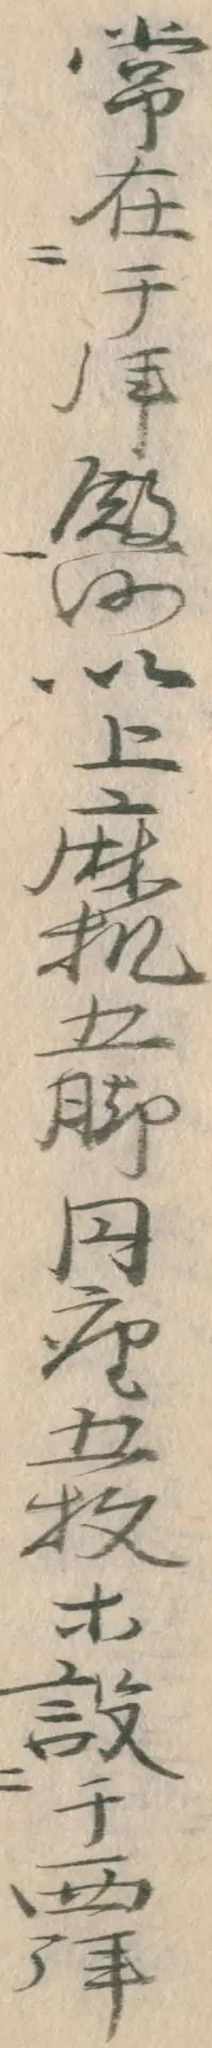常在于津殿仍以上麻机五脚円座五枚等設于西拝
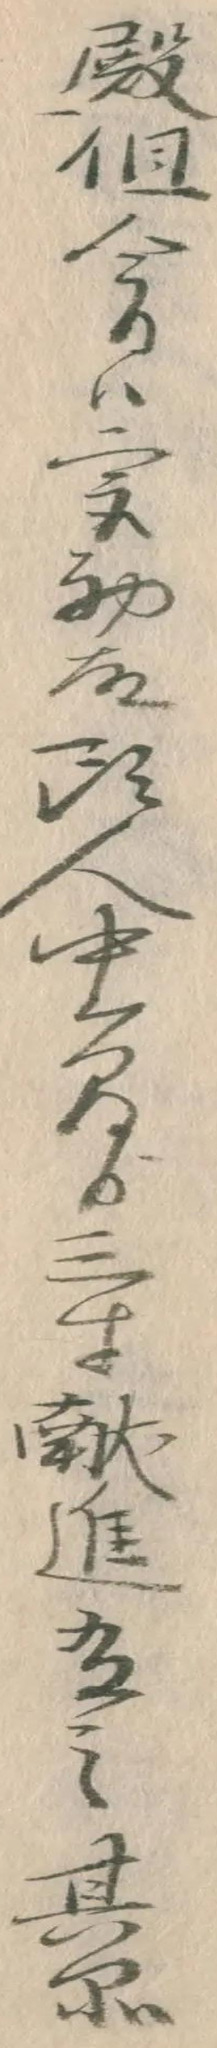殿但今日ハ最初故頭人中間ゟ三寸献進有之其品
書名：賀茂社記録. 第72冊
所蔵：国立国会図書館 National Diet Library, JAPAN
